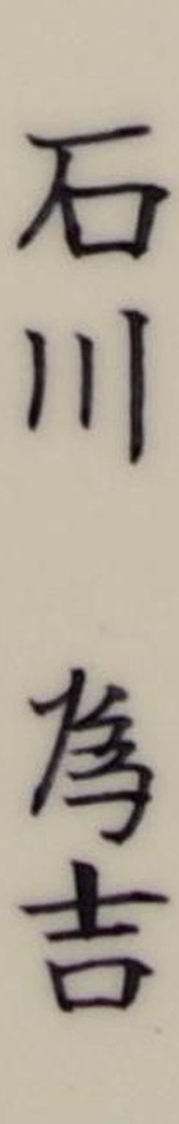石川為吉
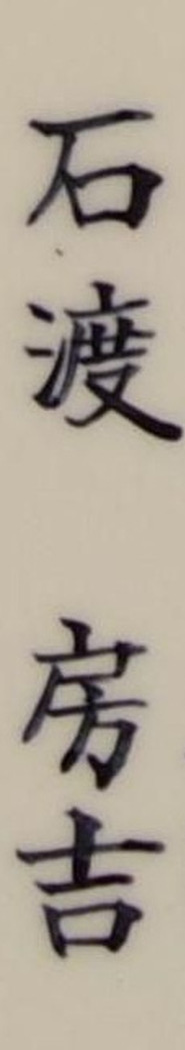石渡房吉
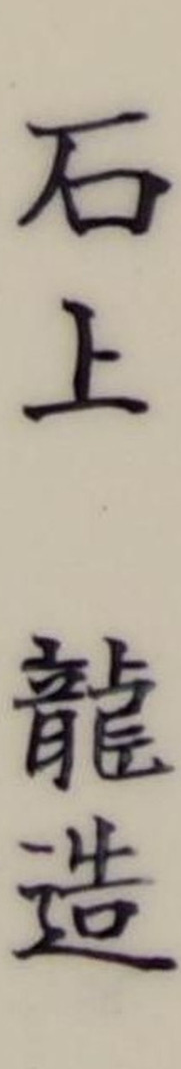石上龍造
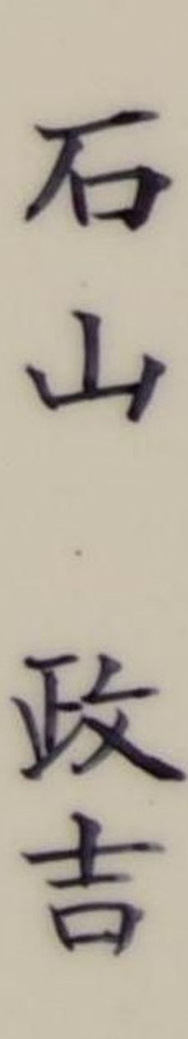石山政吉
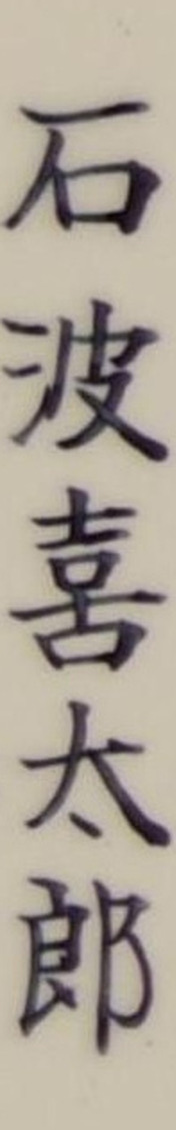石波喜太郎
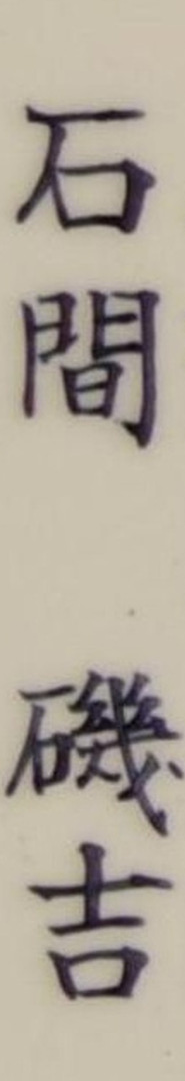石間磯吉
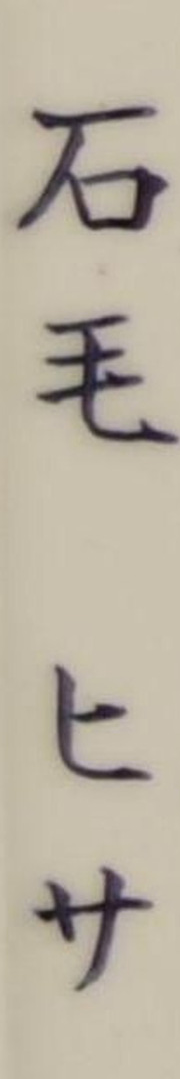石毛ヒサ

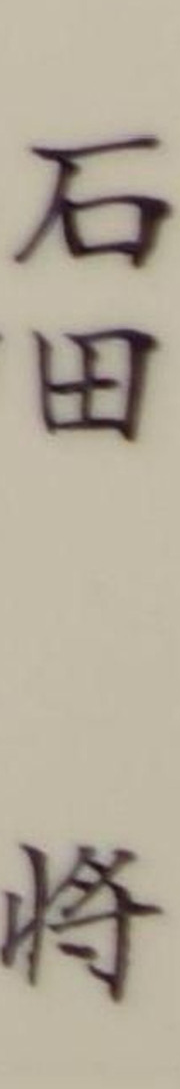石田将
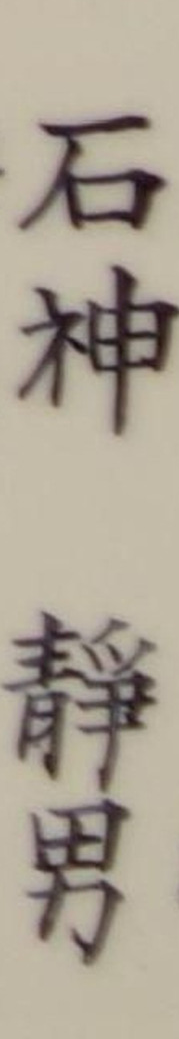石神静男
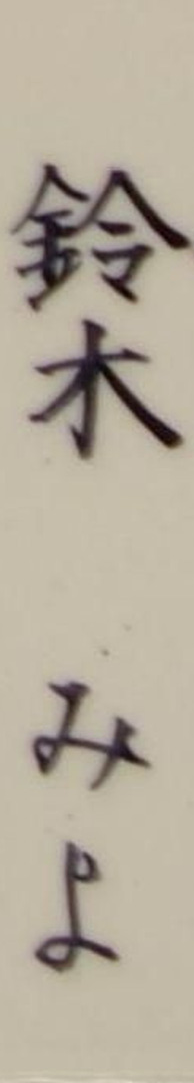鈴木みよ
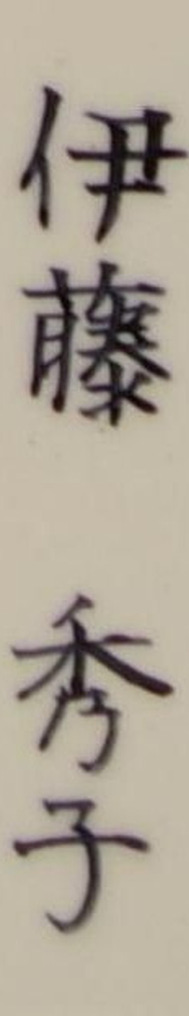伊藤秀子
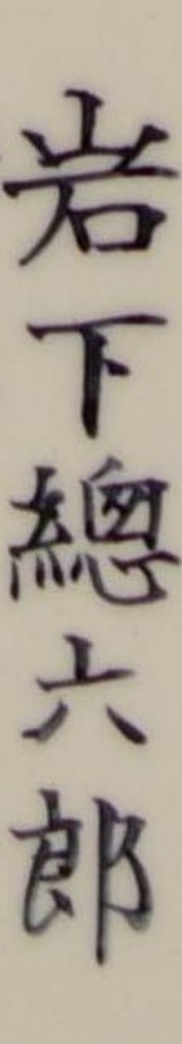岩下総六郎
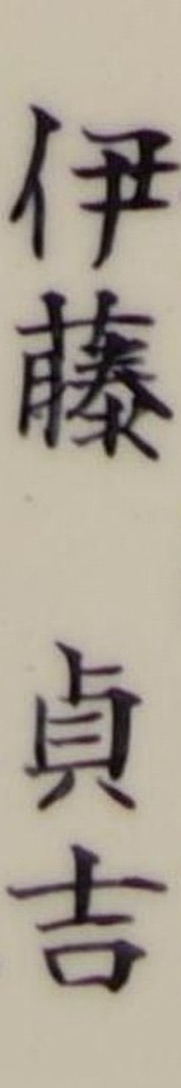伊藤貞吉
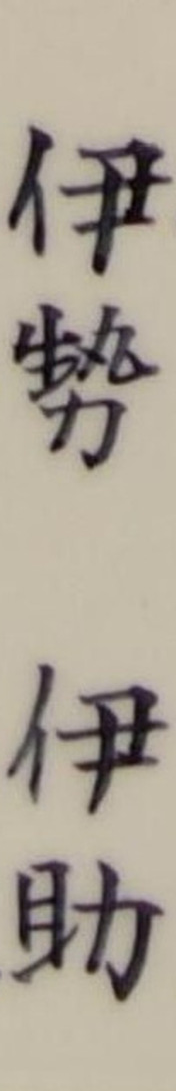伊勢伊助
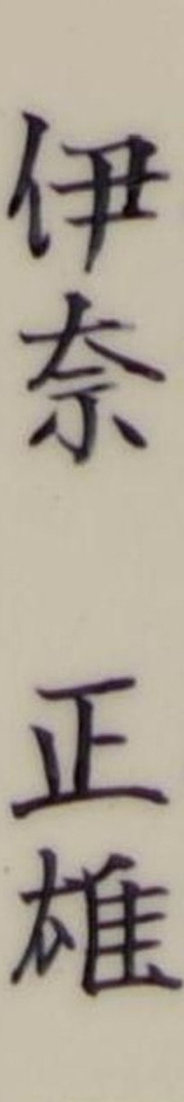伊奈正雄
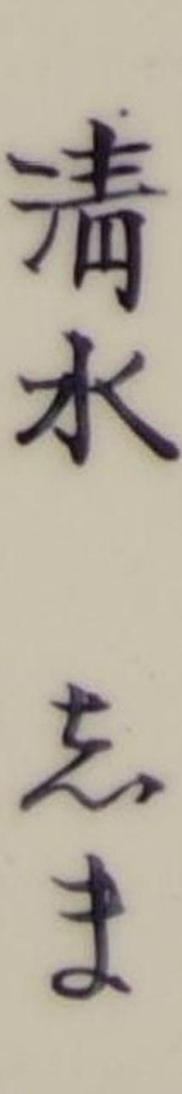清水しま
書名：M~S
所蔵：高野山金剛峯寺
